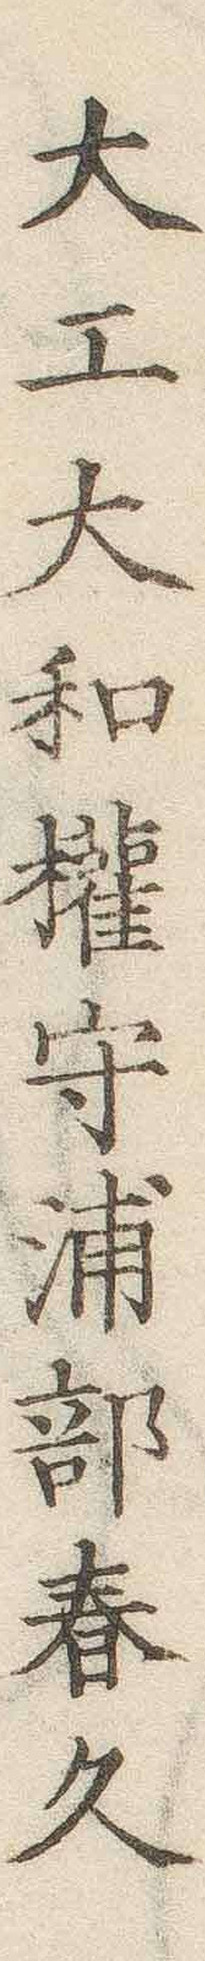大工大和權守浦部春久
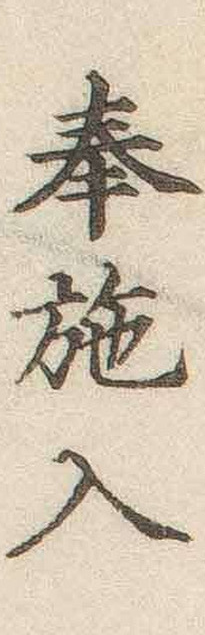奉施入
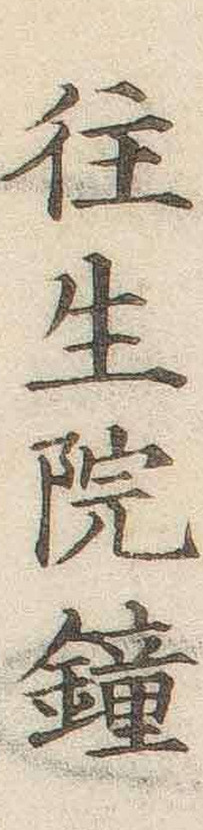往生院鐘
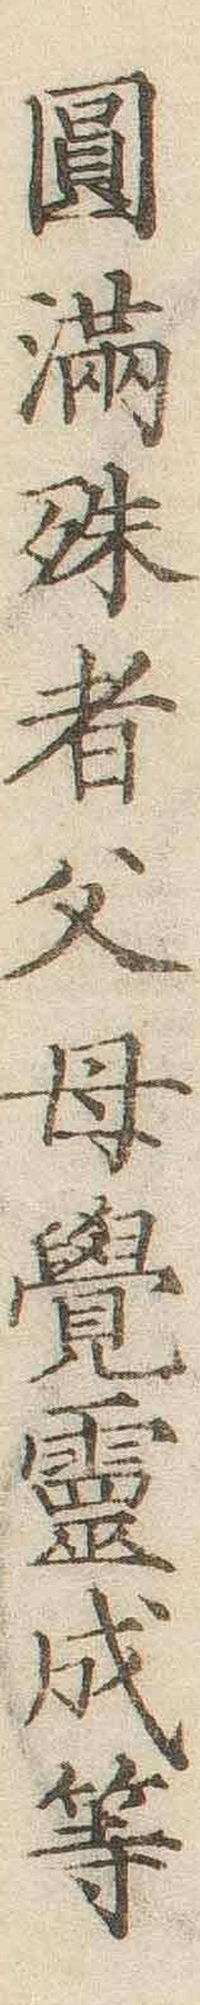圓滿殊者父母覺靈成等
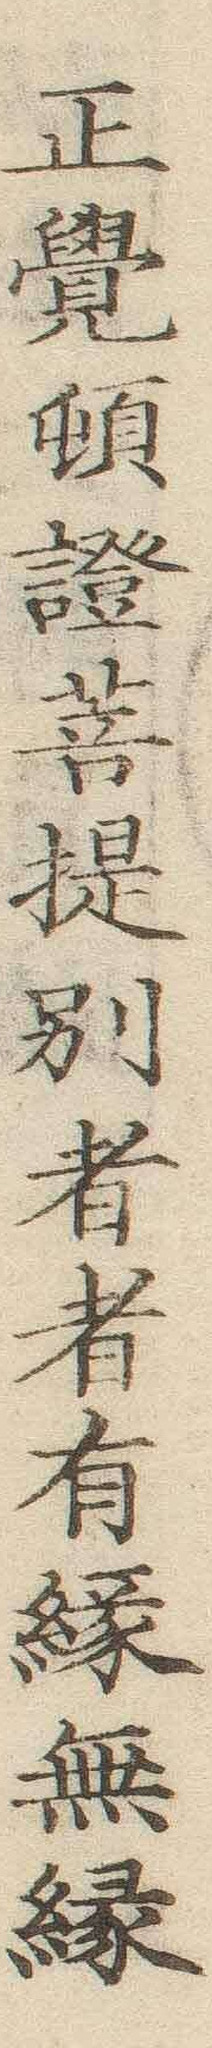正覺頓證菩提別者者有縁無縁

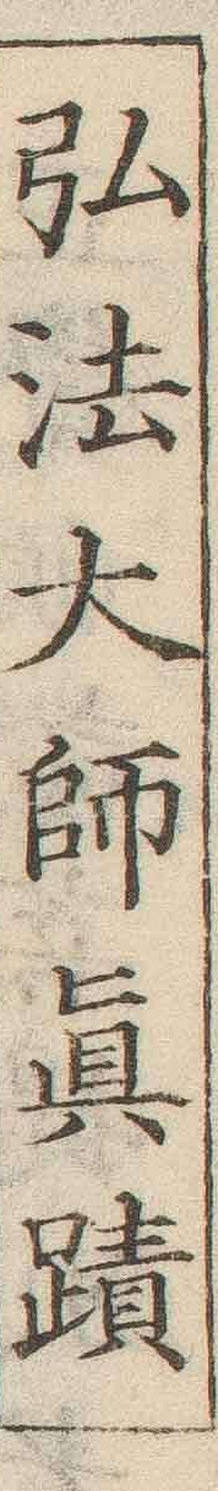弘法大師眞蹟

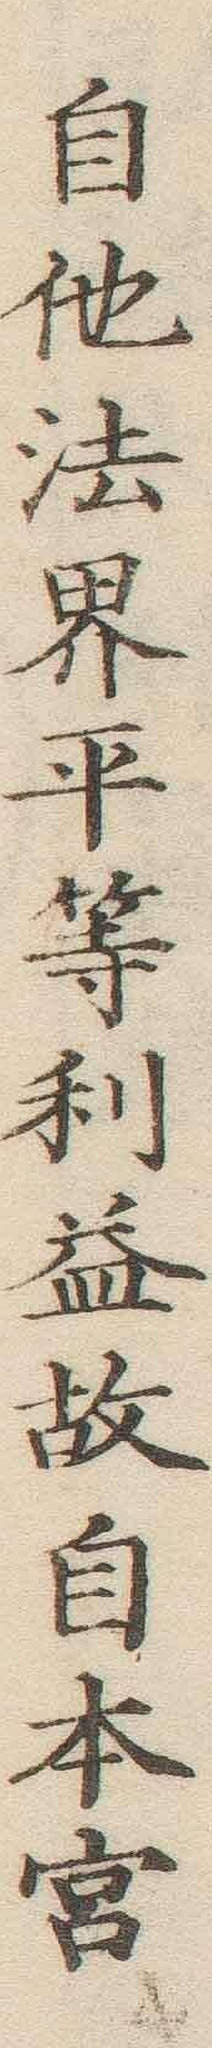自他法界平等利益故自本宮
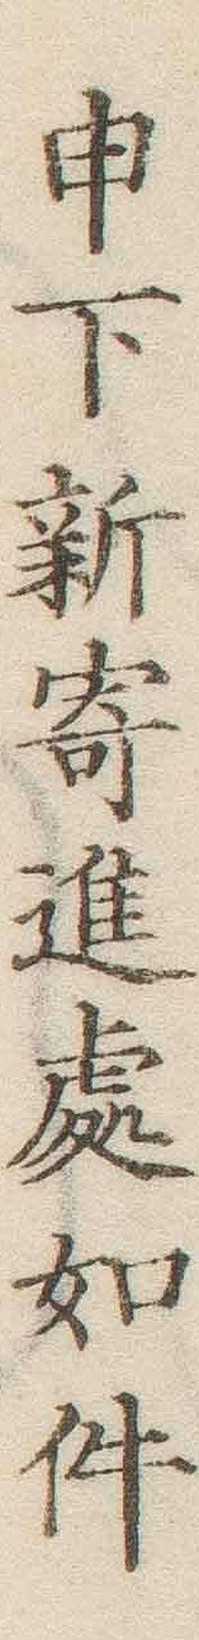申下新寄進處如件
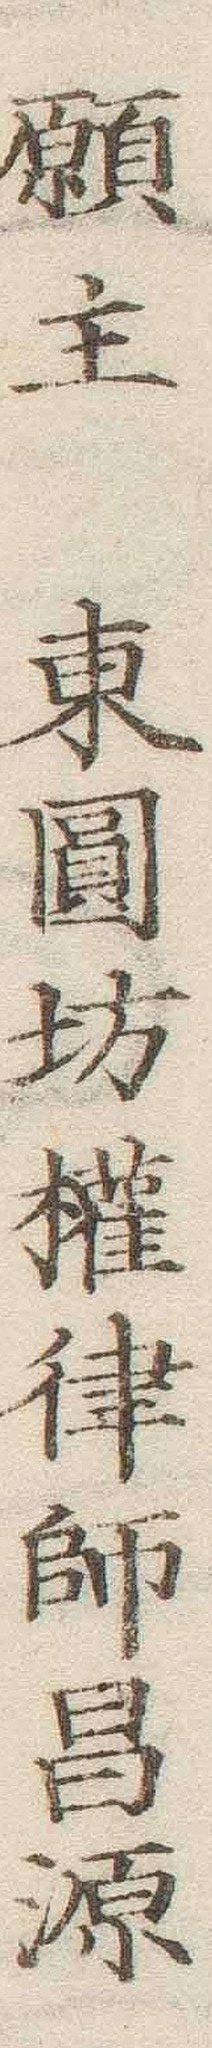願主東圓坊權律師昌源
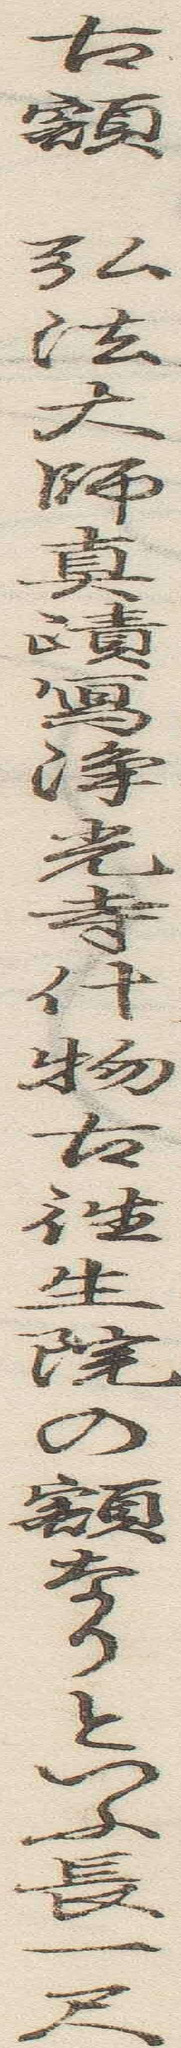古額弘法大師真蹟冩浄光寺什物古徃生院の額なりといふ長一尺
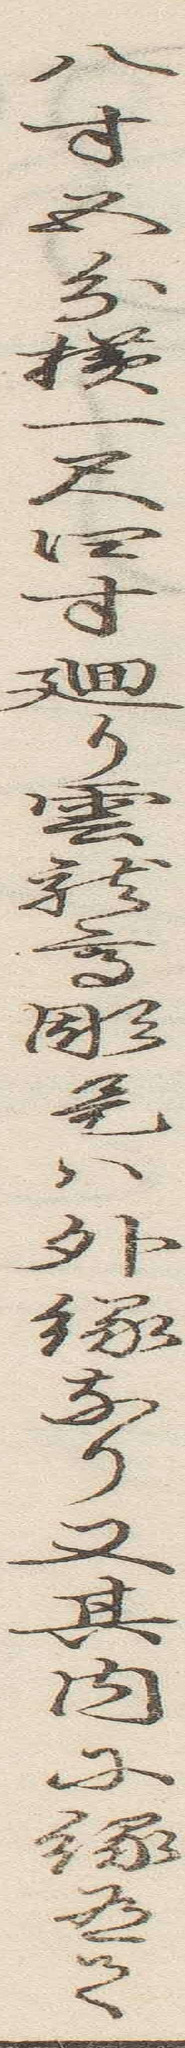八寸五分横一尺四寸廽り雲龍高彫是は外縁なり又其内に縁有て
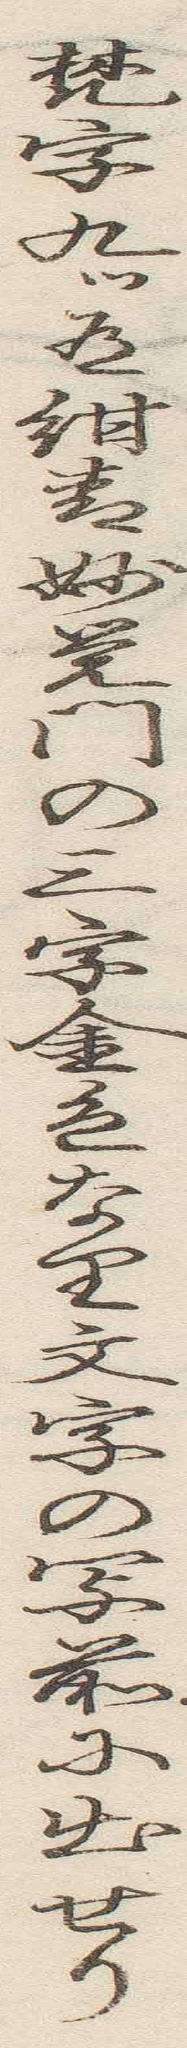梵字九ッ有紺青妙覚門の三字金色なり文字の写前に出せり
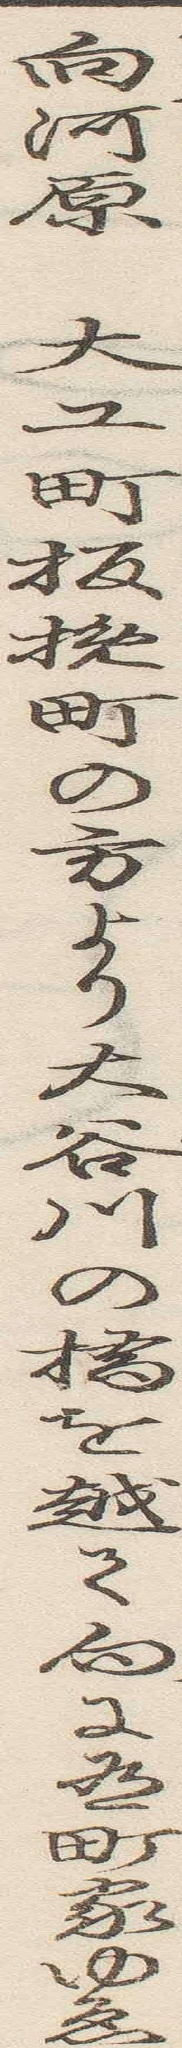向河原大工町板挽町の方より大谷川の橋を越て向に有町家ゆゑ
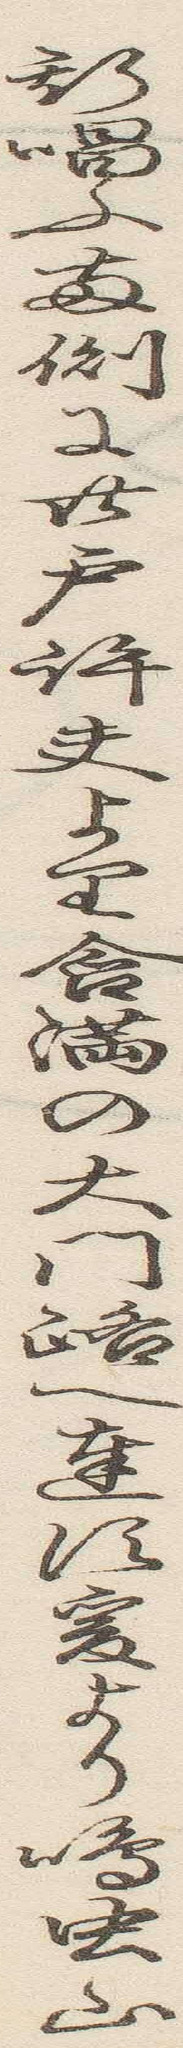斯唱ふ両側に廿戸許夫より含満の大門路へ達す爰より鳴虫山
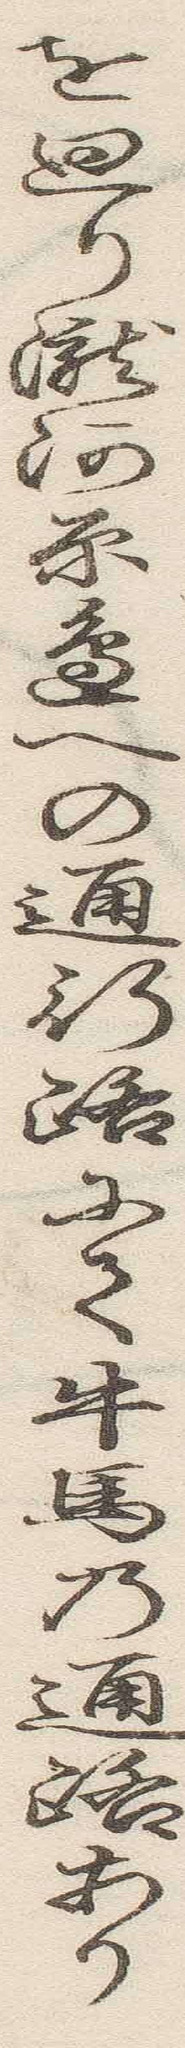を廻り瀧河原邊への通行路にて牛馬の通路あり
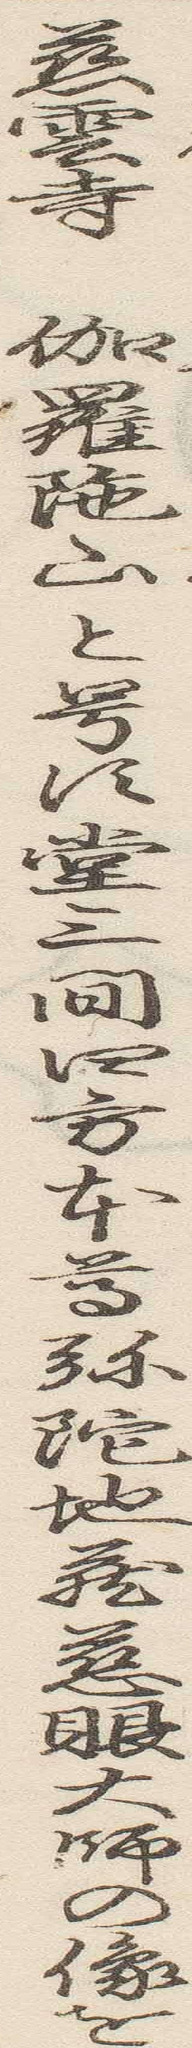慈雲寺伽羅陀山と号す堂三間四方本尊弥陀地蔵慈眼大師の像を
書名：日光山志
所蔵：東京学芸大学附属図書館 国文学研究資料館
